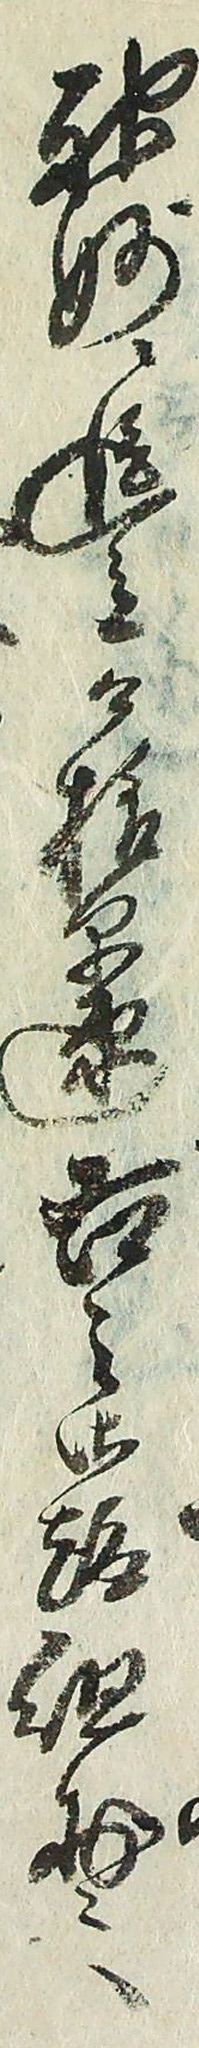神妙に追立候様早速右之御趣組村々へ
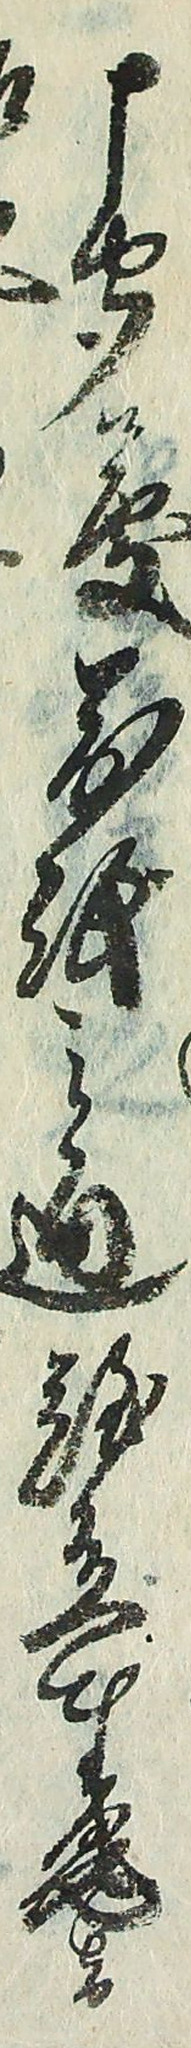申聞候処別紙之通難有奉畏旨
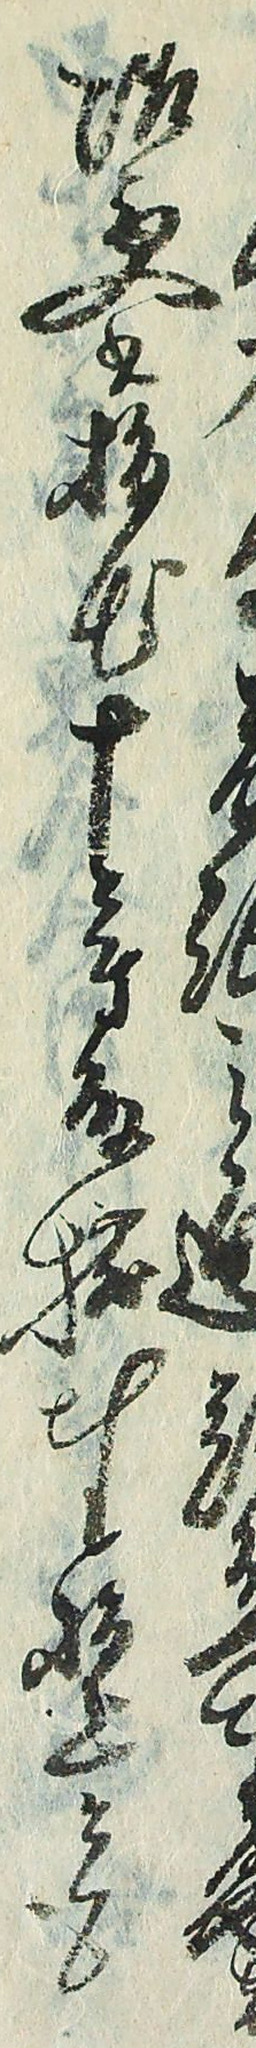御受書指出申に付取揃奉指上候以上
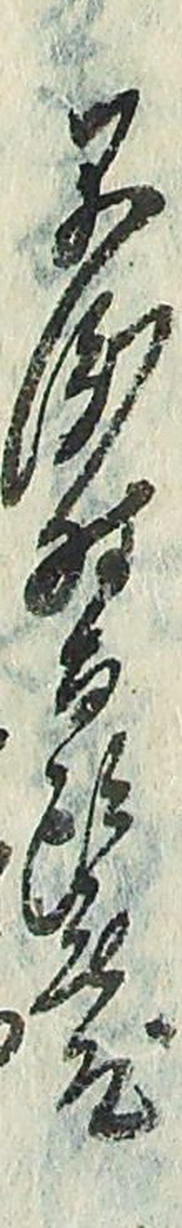早淵村与頭庄屋
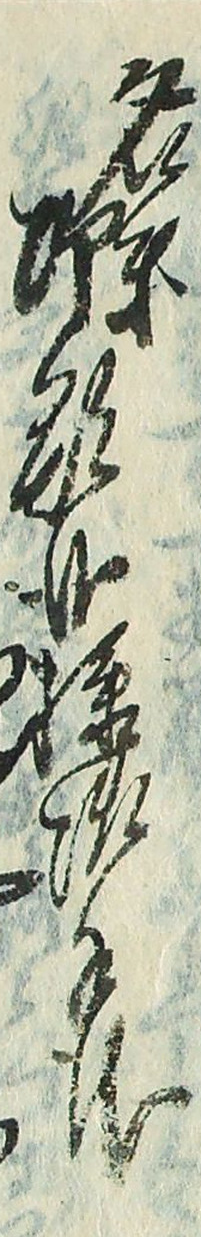御郡代様御手代
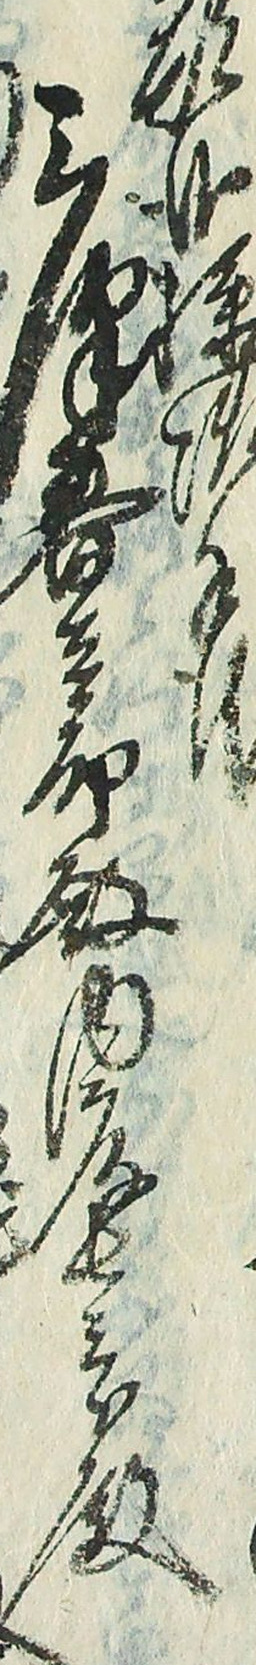三沢春太郎殿内藤長三郎殿
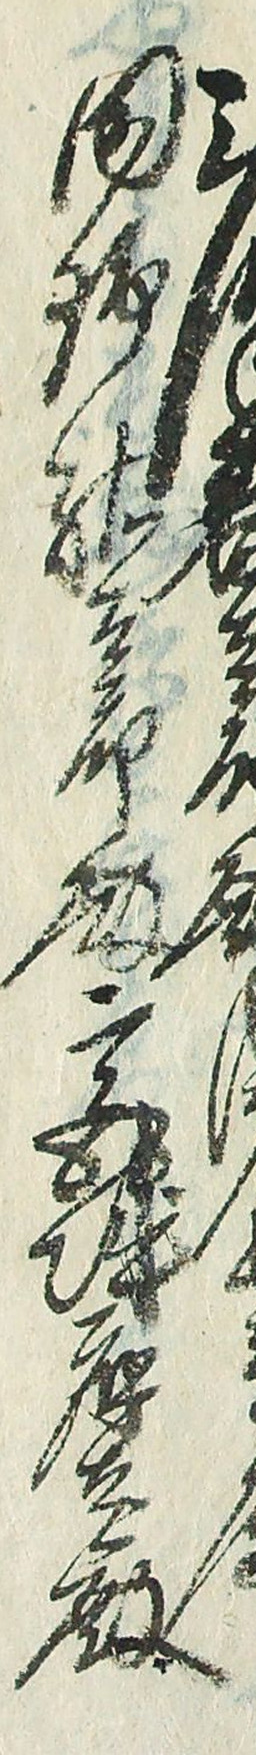田野祐太郎殿宮城麻太郎殿

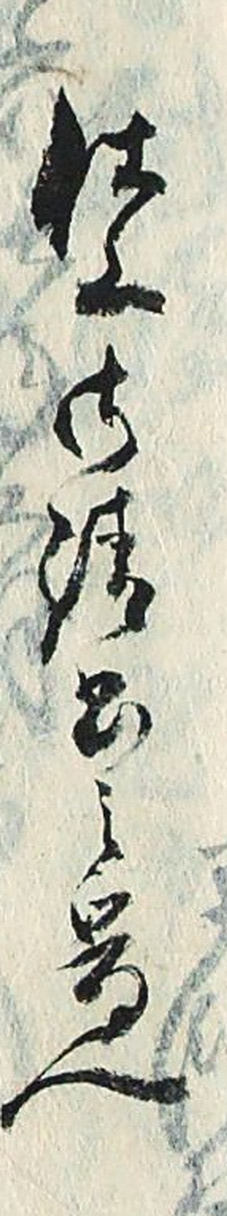仕上御請書之覚
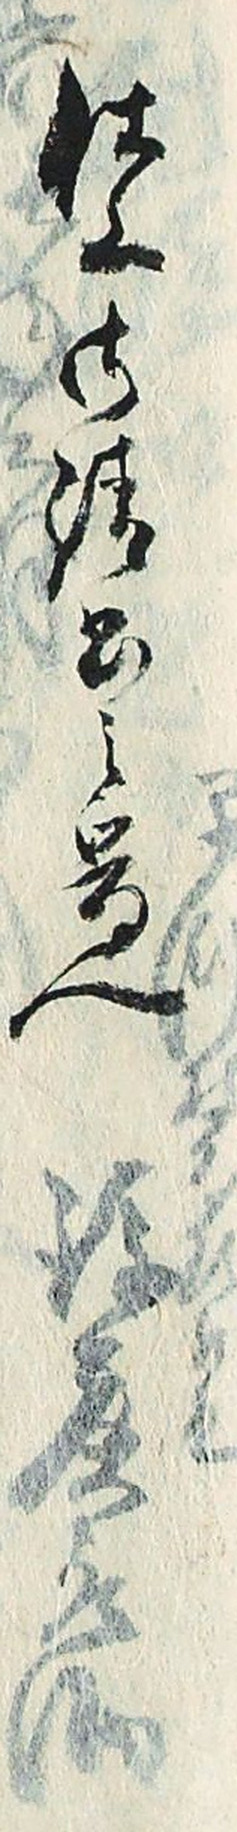仕上御請書之覚
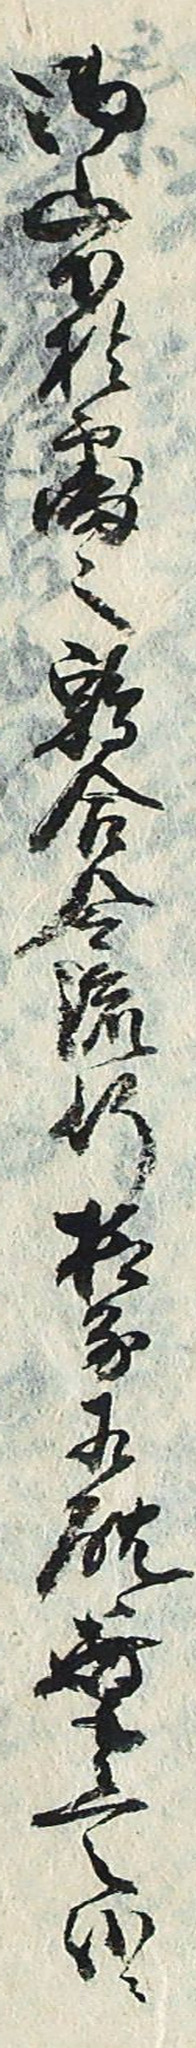御山下於処々鶏合令流行格別相耽候者も有之哉に
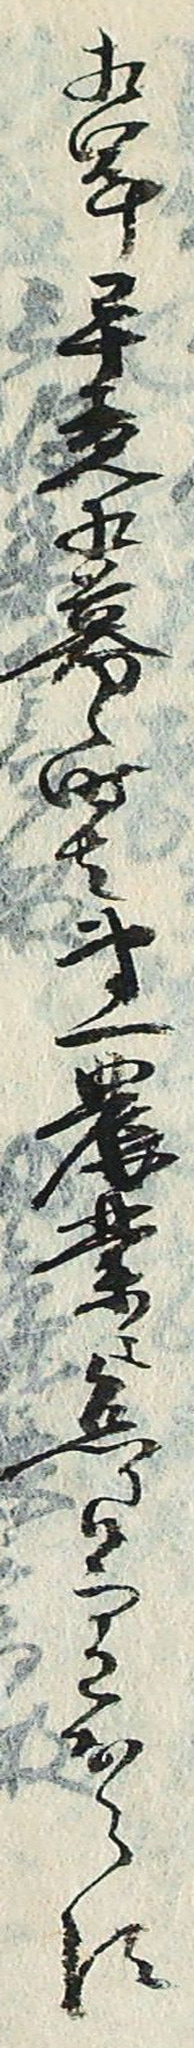相聞畢竟相募候時は第一農業に怠り候而已ならす
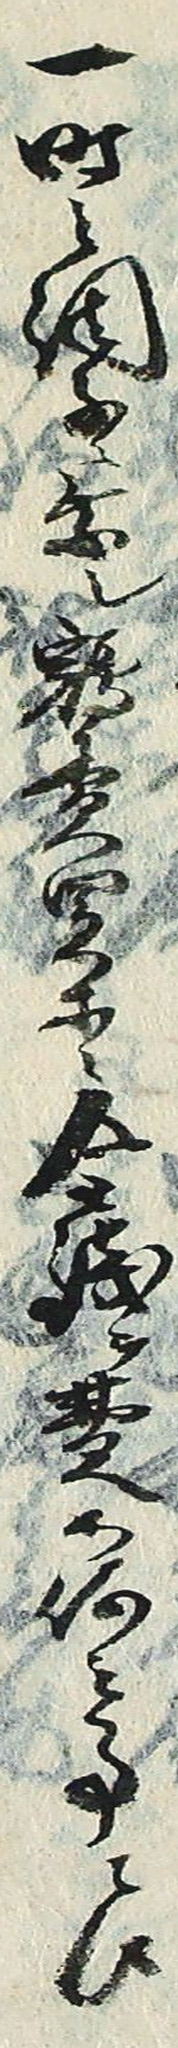一時之調子に乗し鶏売買等に金銭を費如何之事に候
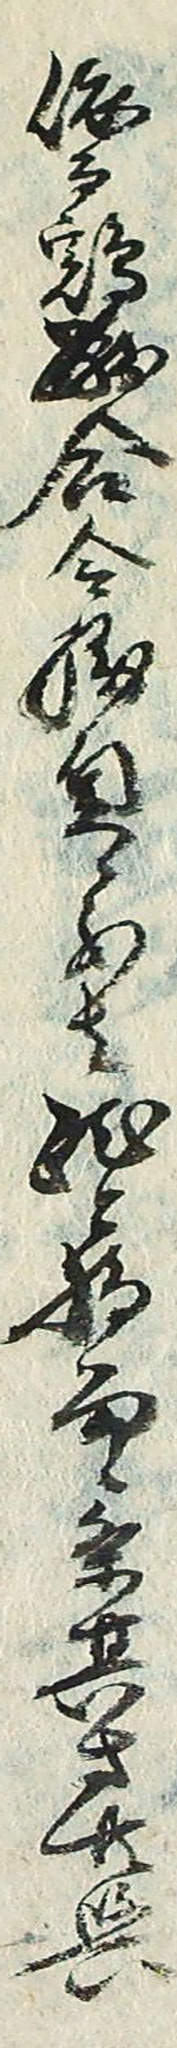依而鶏蹴合令勝負候義は屹と指留候条其方共与
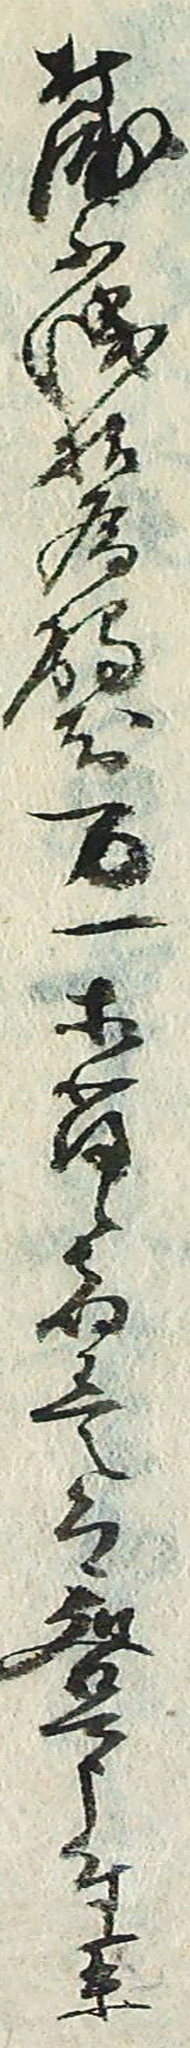村浦不洩様為触知万一相背候者有之候はゝ咎可申付候条
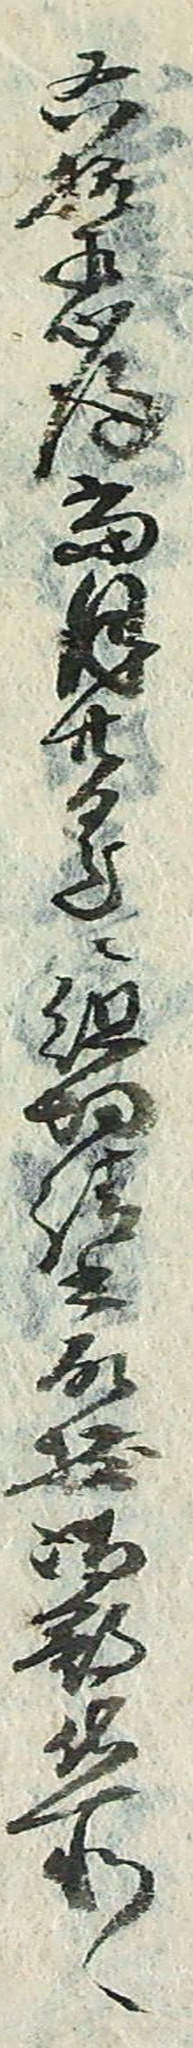右様相心得当月廿日迄に組切請書取揃御郡代所へ
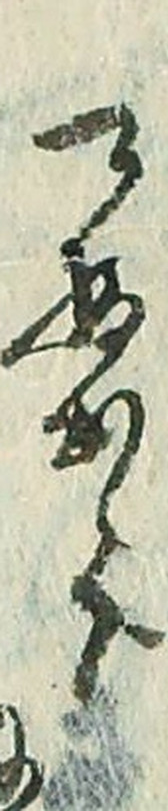可指出候以上
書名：諸御用御□受書控
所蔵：鳴門教育大学 Naruto University of Education
